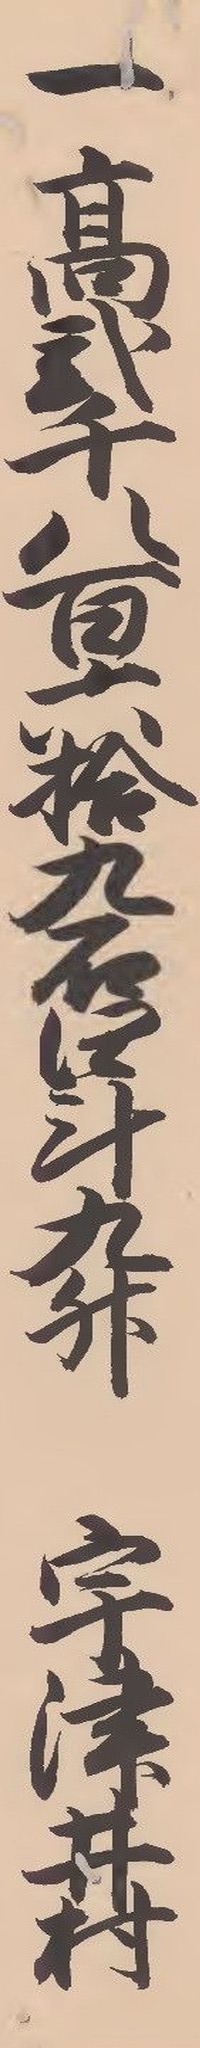一高弐千八百六拾九石四斗九升宇津井村
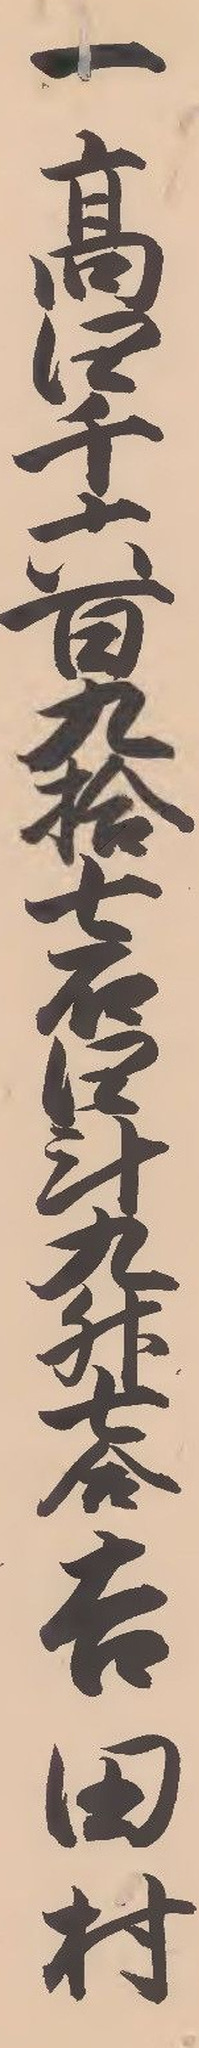一高四千六百九拾七石四斗九升七合吉田村
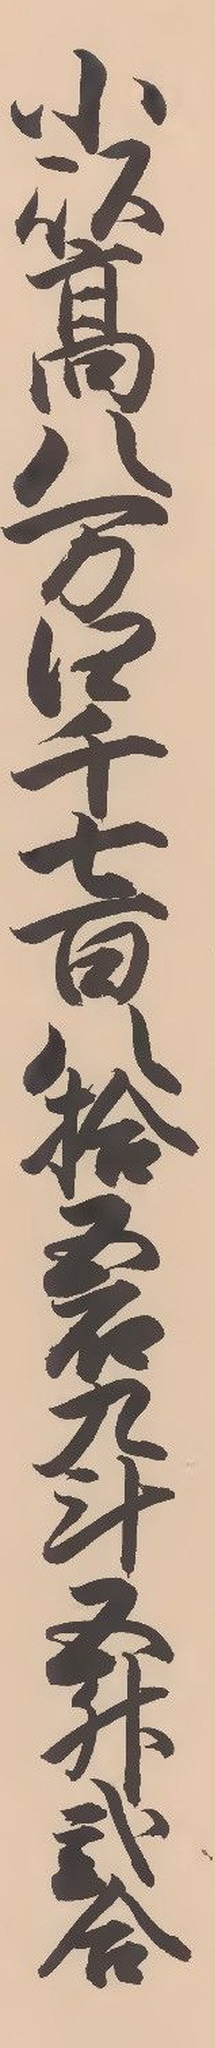小以高八万四千七百八拾五石九斗五升弐合

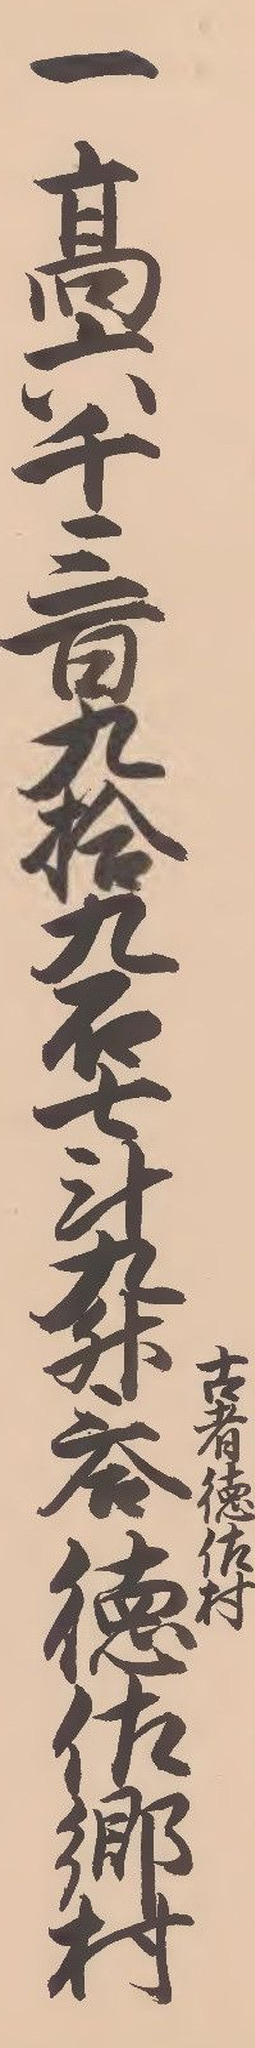一高六千三百九拾九石七斗九升三合徳佐郷村
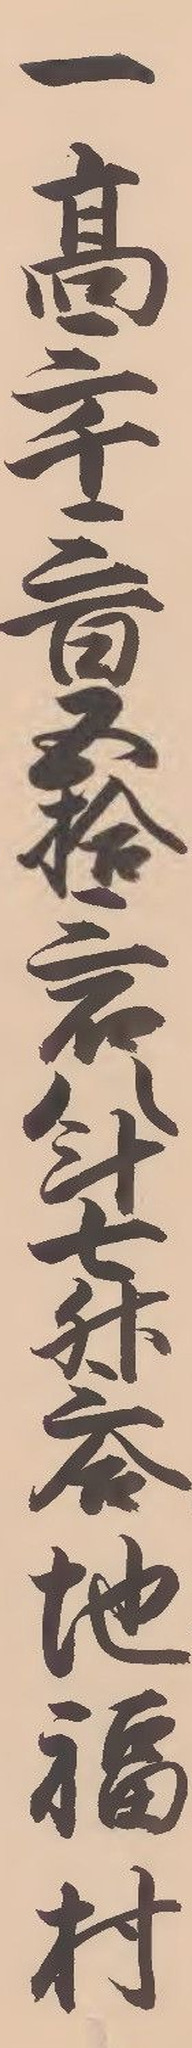一高三千三百五拾三石八斗七升三合地福村
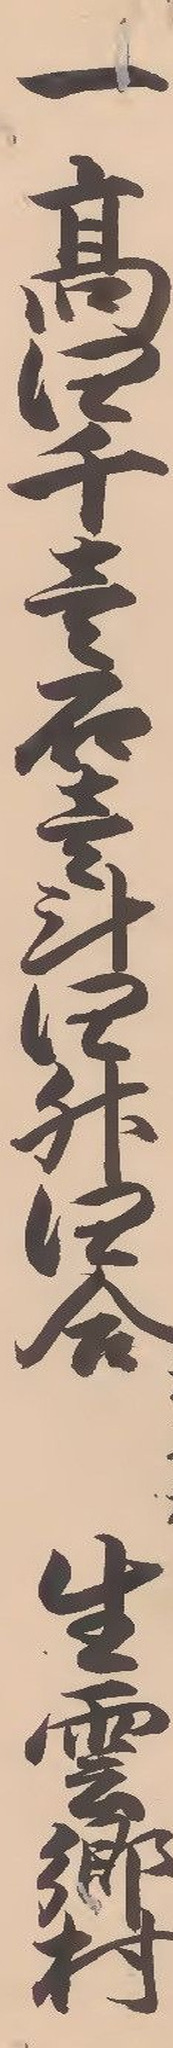一高四千壱石壱斗四升四合生雲郷村
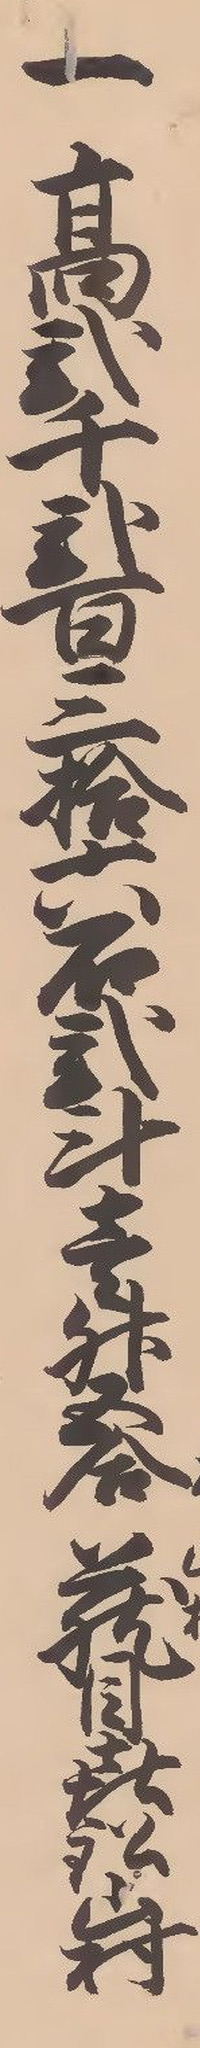一高弐千弐百三拾六石弐斗壱升五合蔵目喜鉛山村
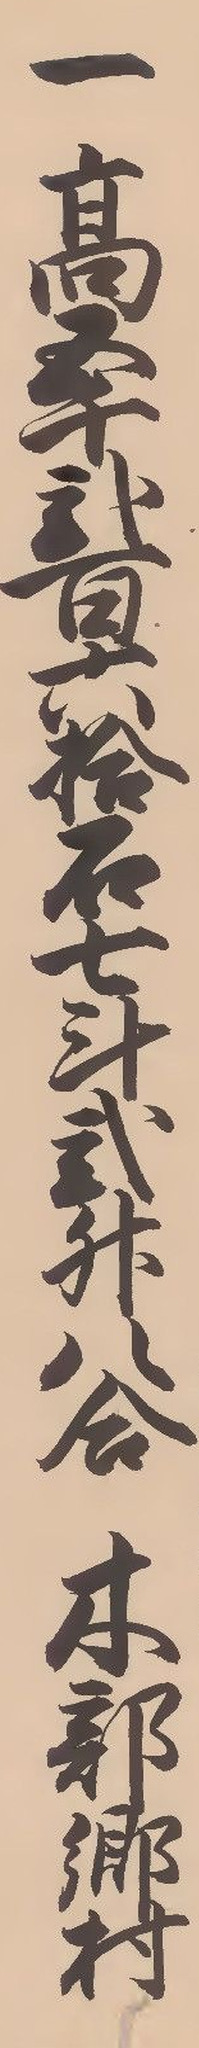一高五千弐百六拾石七斗弐升八合木部郷村
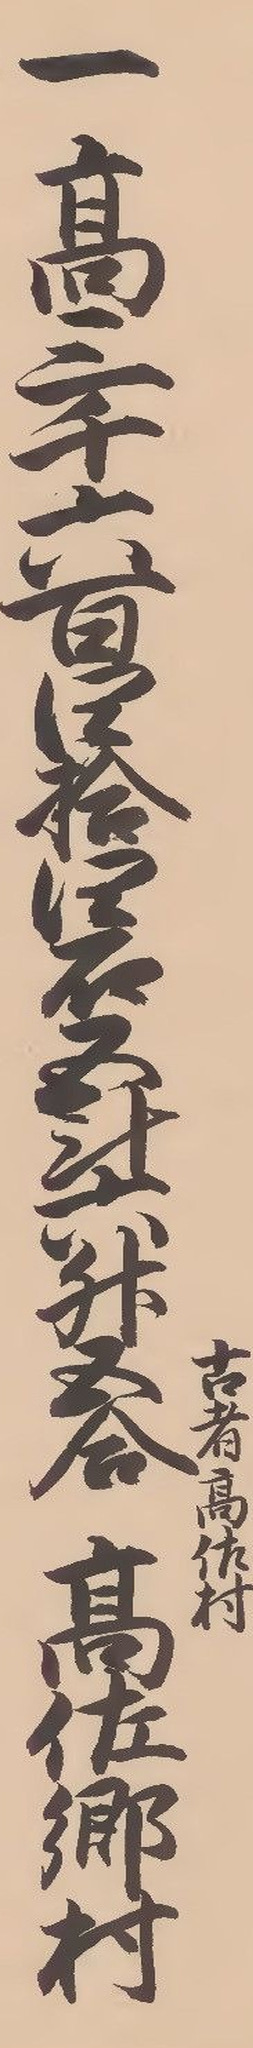一高三千六百四拾四石五斗六升五合高佐郷村
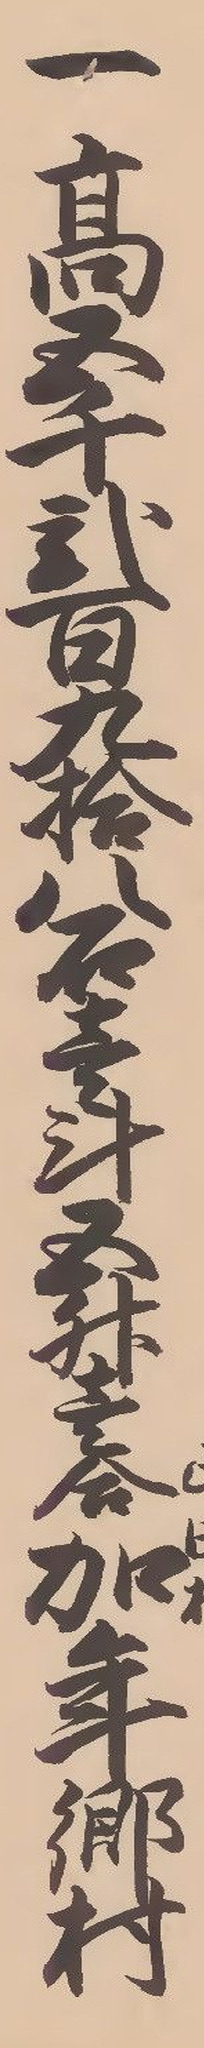一高五千弐百九拾八石壱斗五升壱合加年郷村

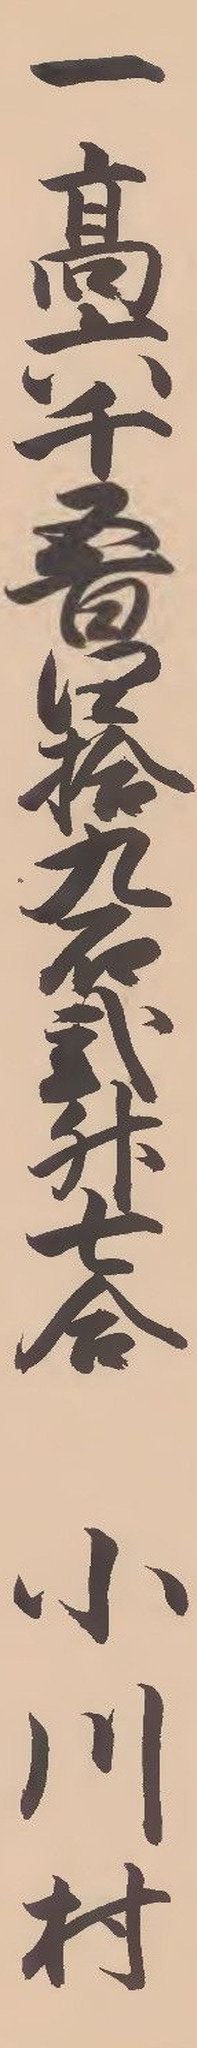一高六千五百四拾九石弐升七合小川村
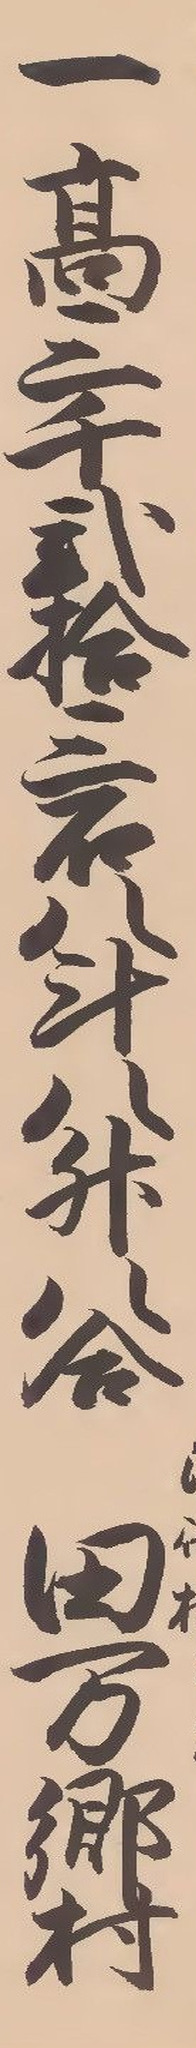一高三千弐拾三石八斗八升八合田万郷村
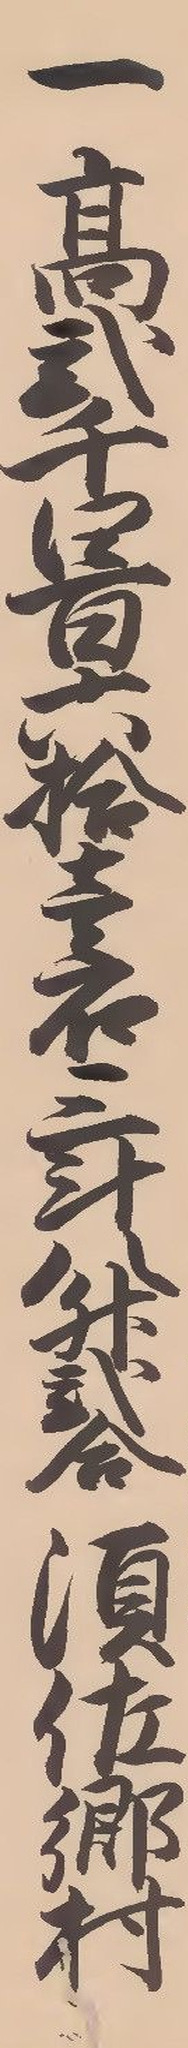一高弐千四百六拾壱石三斗八升弐合須佐郷村
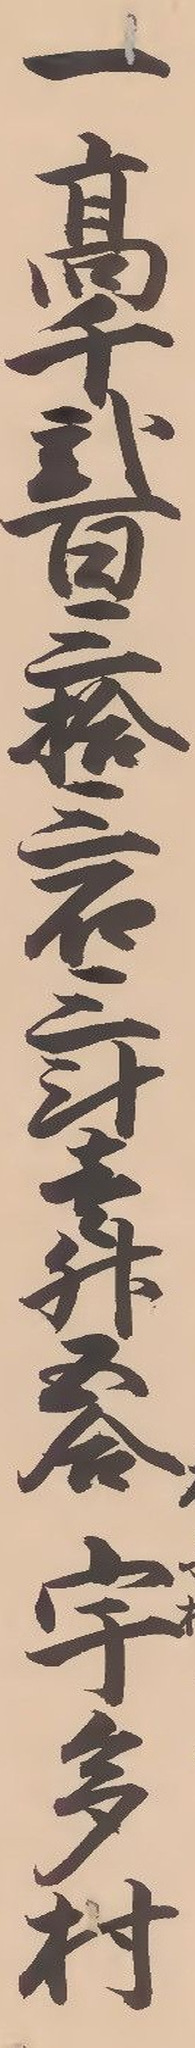一高千弐百三拾三石三斗壱升五合宇多村
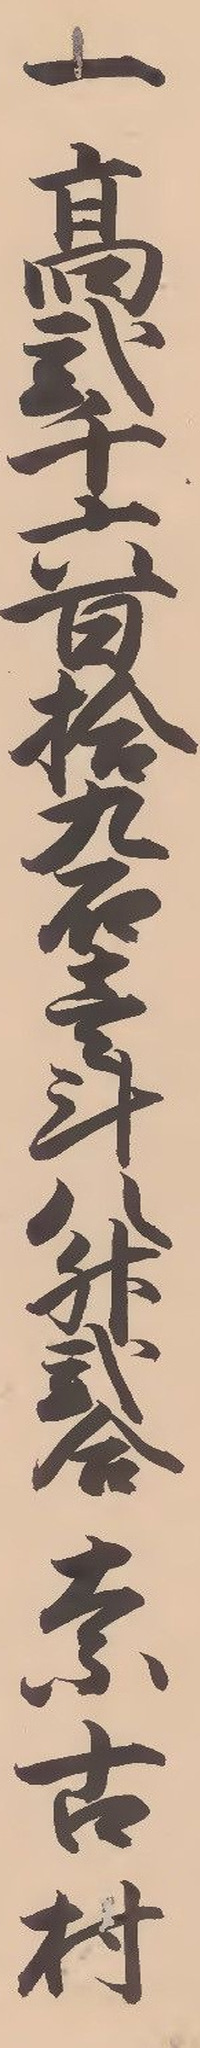一高弐千六百拾九石壱斗八升弐合奈古村
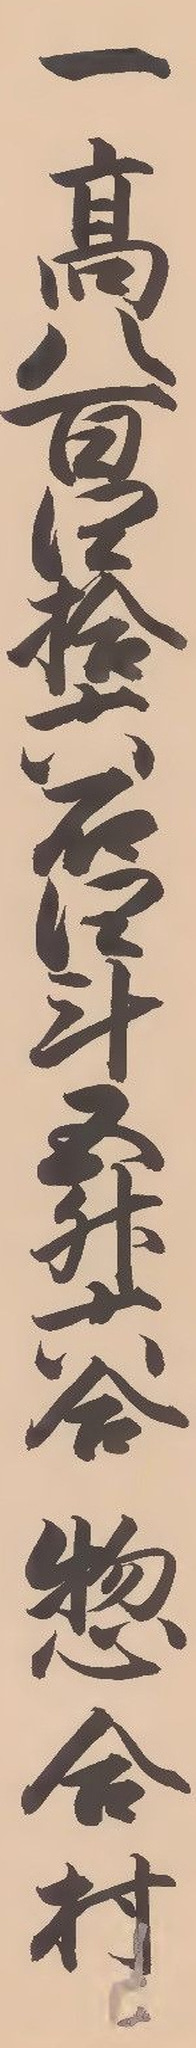一高八百四拾六石四斗五升六合惣合村
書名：長門国郷帳
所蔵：国立公文書館 National Archives of Japan
